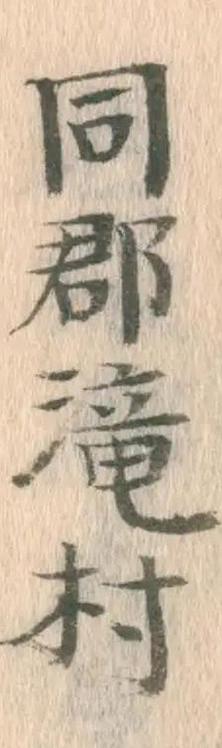同郡滝村
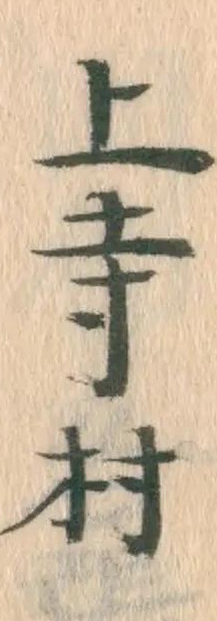上手村
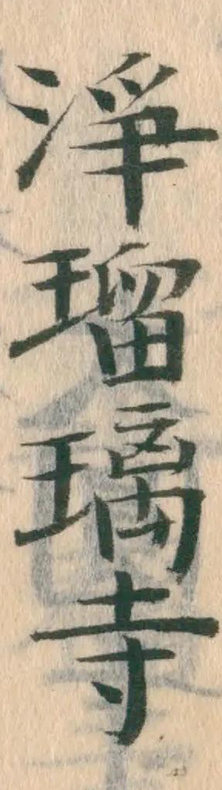浄瑠璃寺
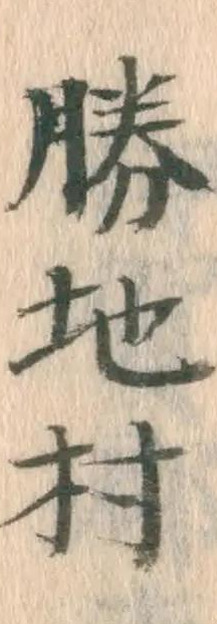勝地村
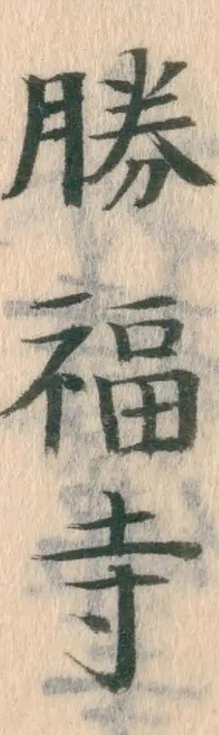勝福寺
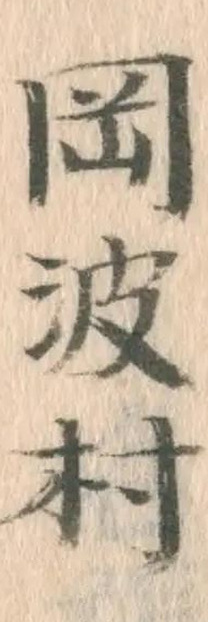岡波村
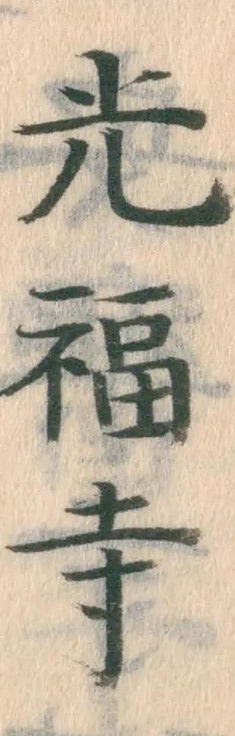光福寺
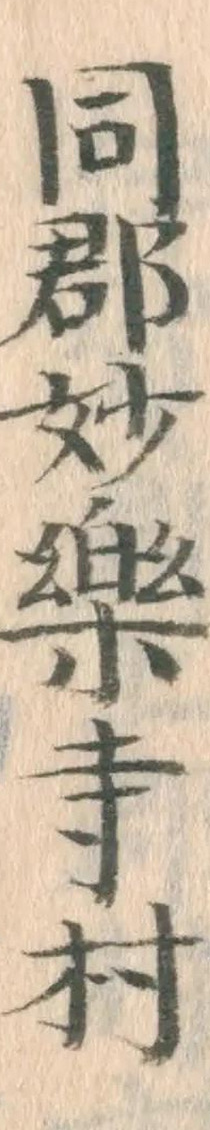同郡妙楽寺村
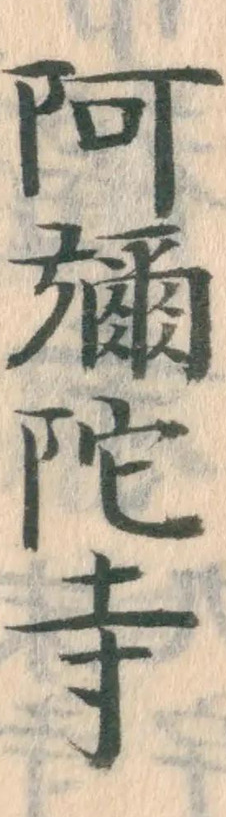阿弥陀寺

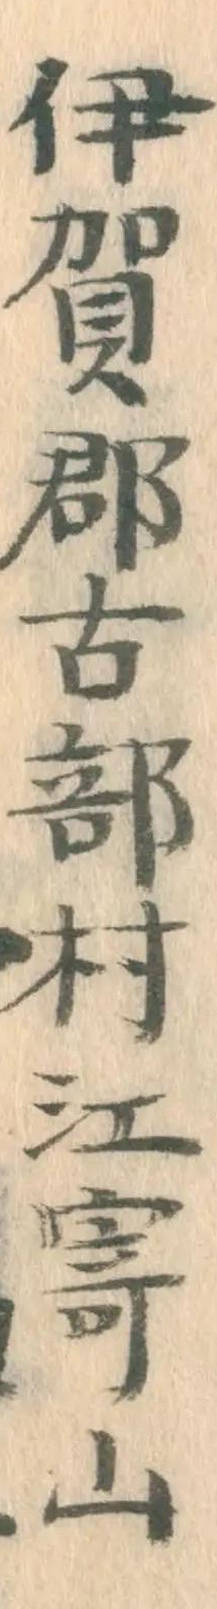伊賀郡古部村江寄山
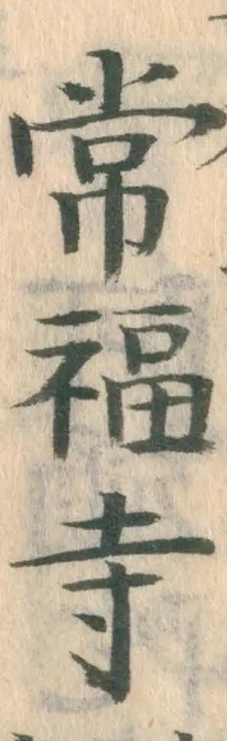善福寺
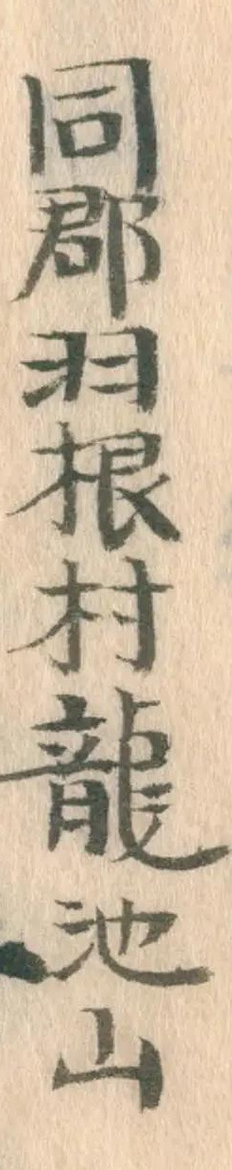同郡羽根村龍地山
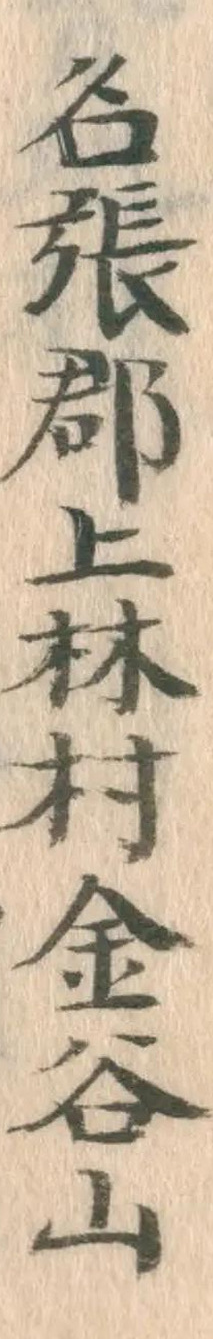名張郡上林村金谷山
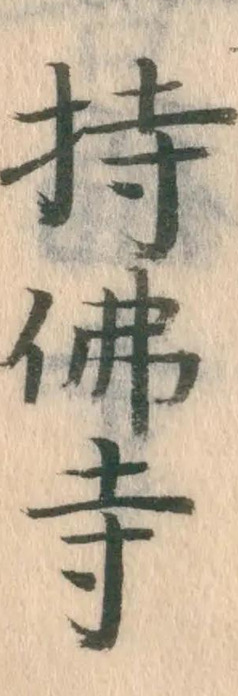持仏寺
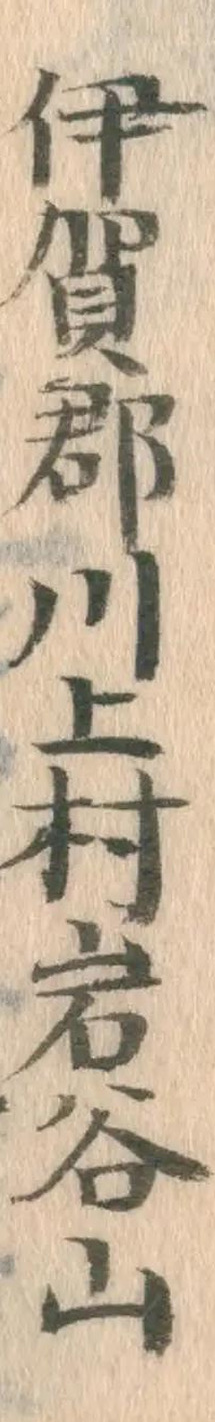伊賀郡川上村岩谷山
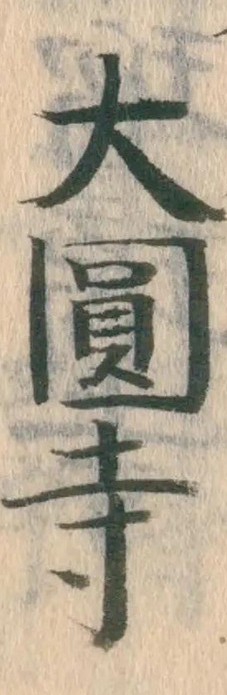大円寺
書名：古義真言宗本末帳 21巻. [4] 第三 伊賀国、伊勢国、志摩国、尾張国、三河国、遠江国、駿河国、伊豆国、甲斐国
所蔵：国立国会図書館 National Diet Library, JAPAN
